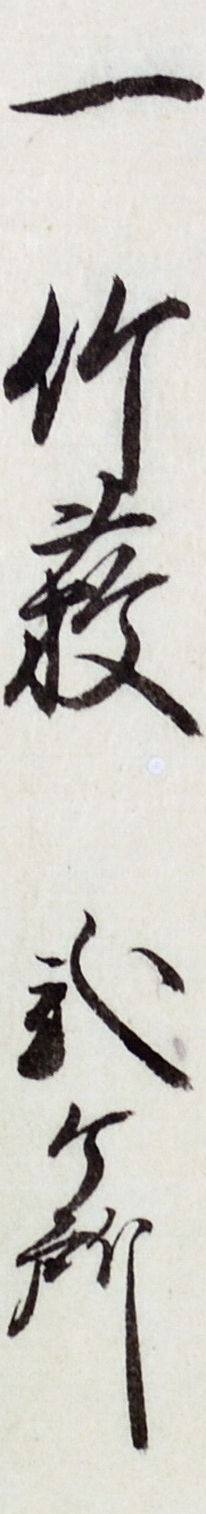一竹藪弐ケ所
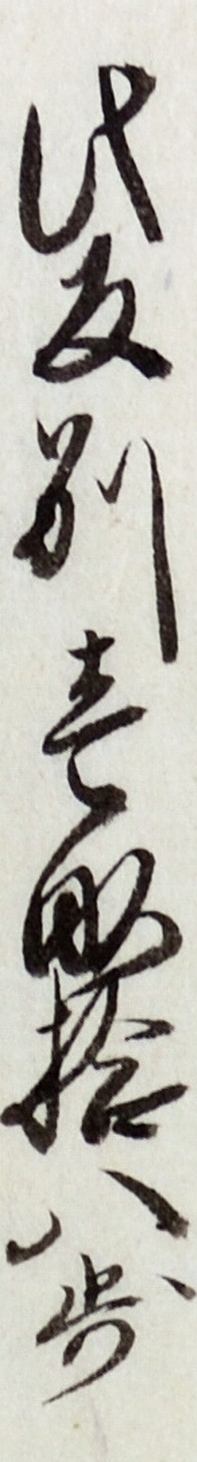此反別壱畝拾八歩
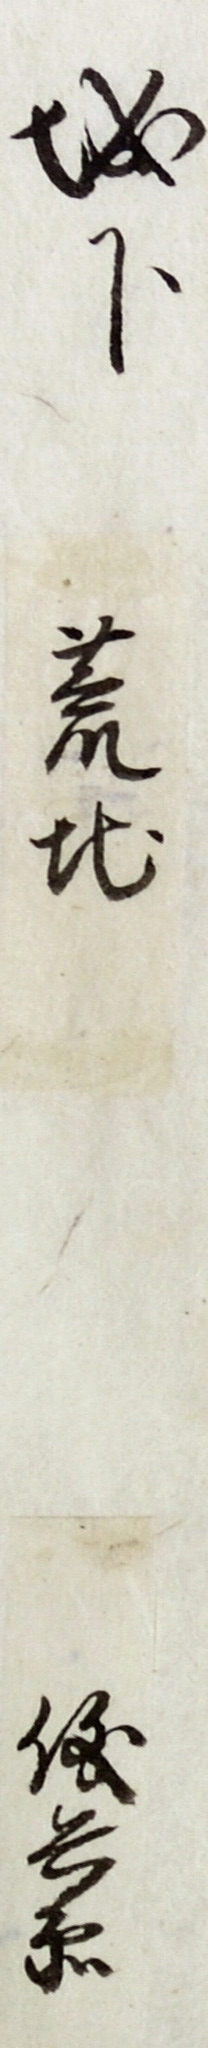城下荒地儀兵衛
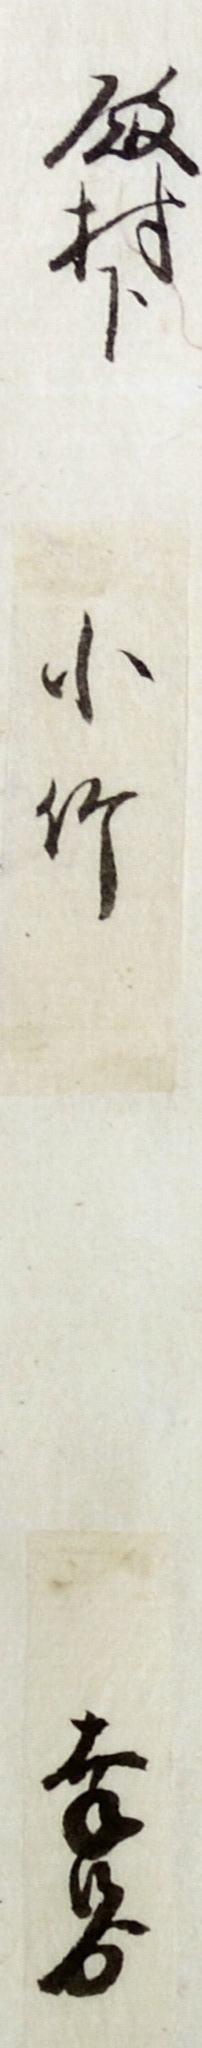殿村下小竹幸左衛門

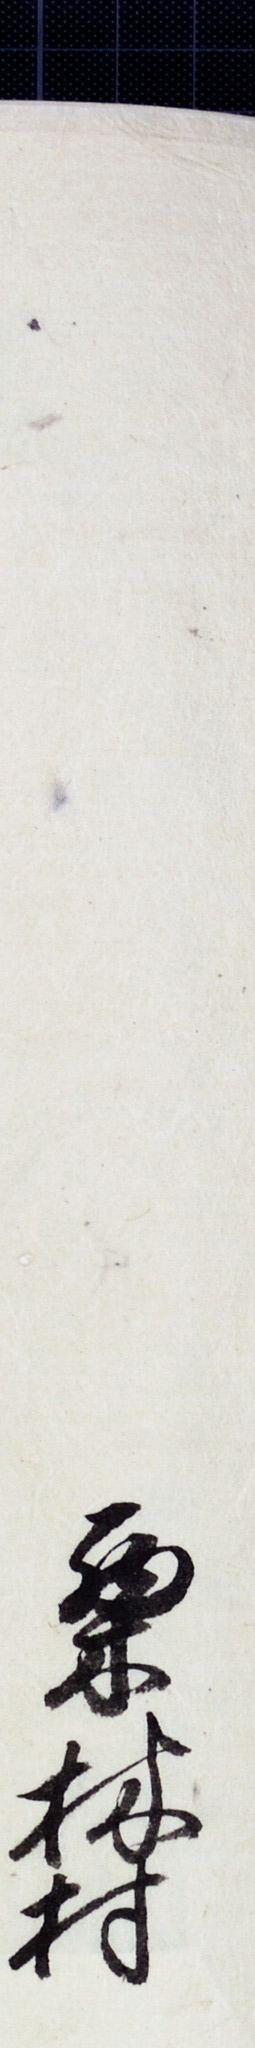栗林村
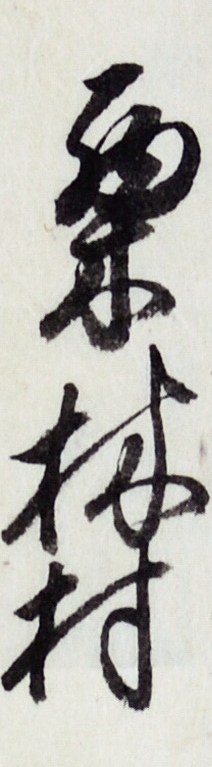栗林村
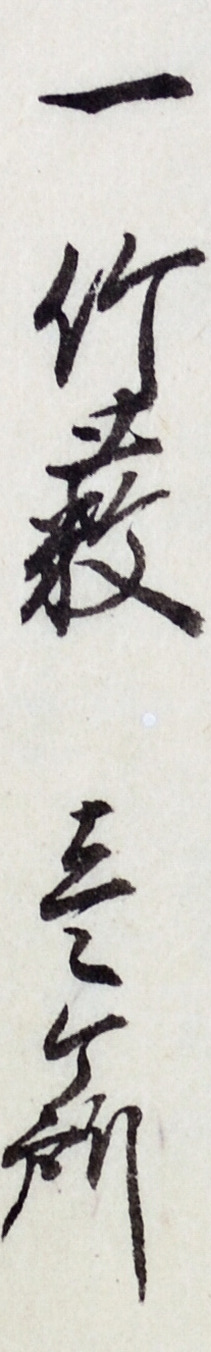一竹藪壱ケ所
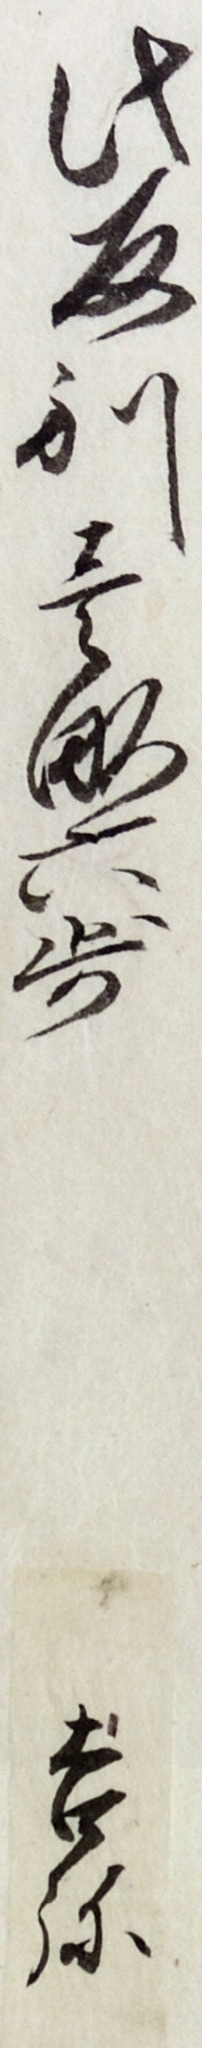此反別壱畝六歩吉弥

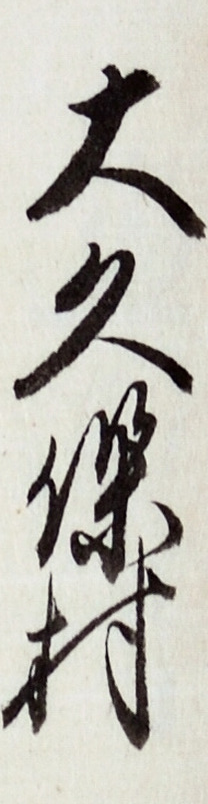大久保村
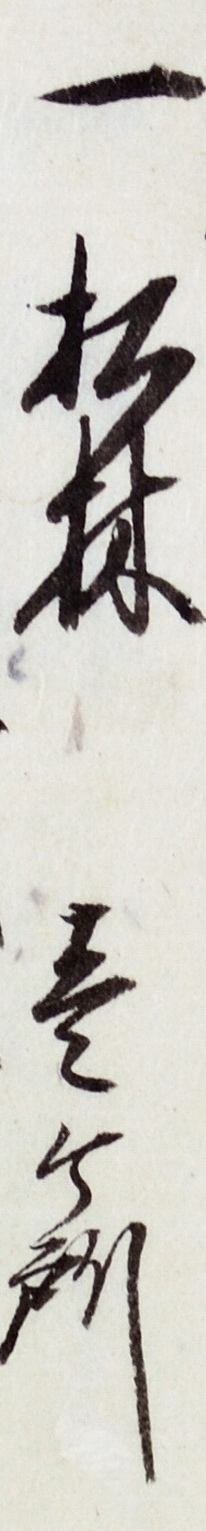一松林壱ケ所
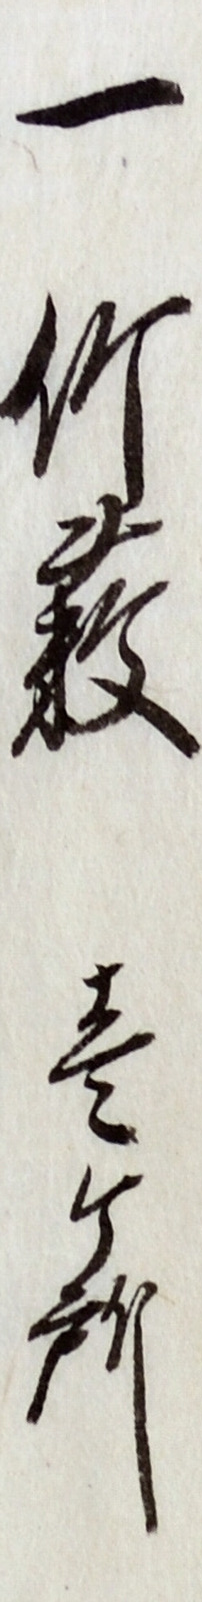一竹藪壱ケ所
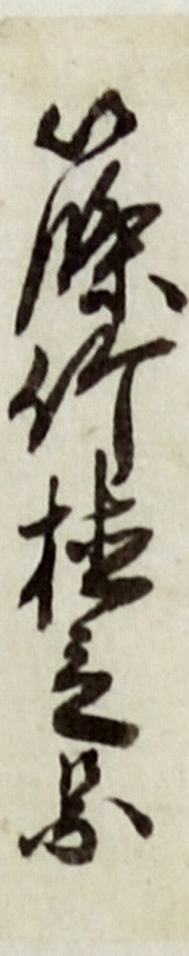篠竹植立図

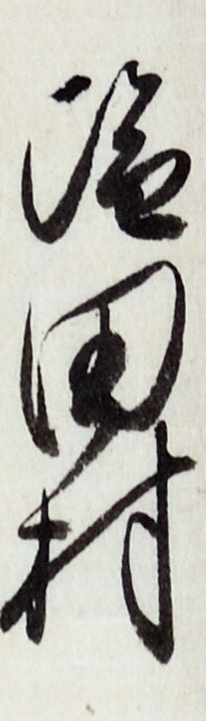塩田村
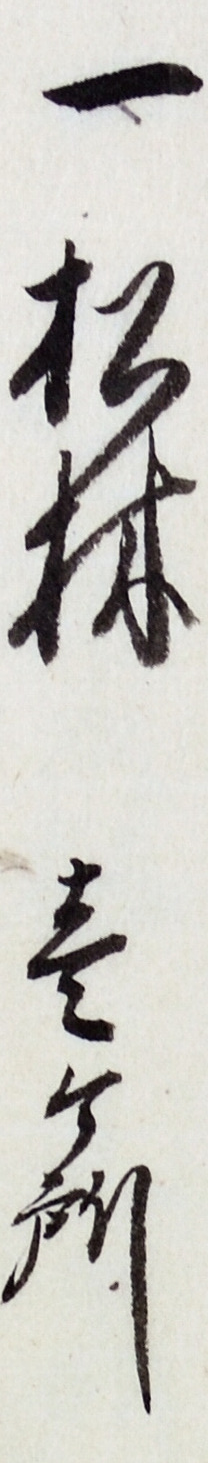一松林壱ケ所
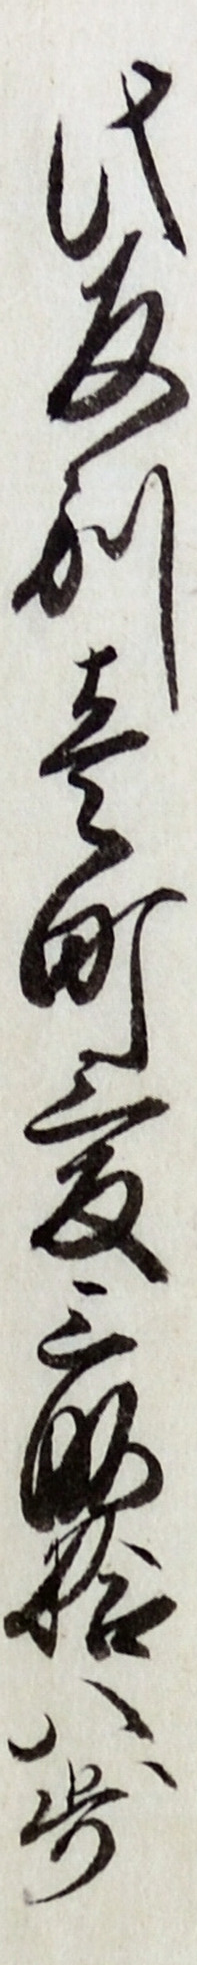此反別壱町三反三畝拾八歩
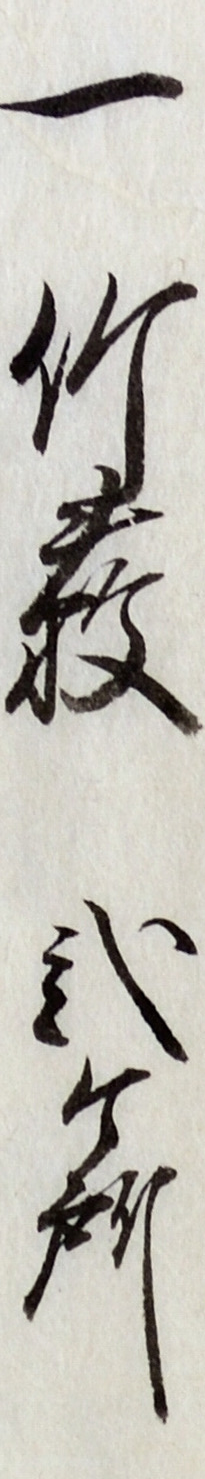一竹藪弐ケ所
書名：御領分中御林御藪附帳
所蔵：伊那市立高遠町図書館・合同会社AMANE
